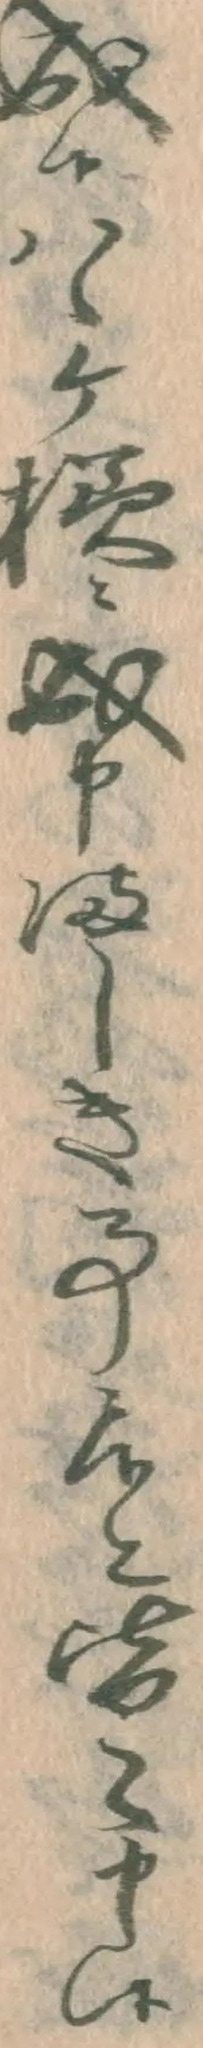成候はゝけ様に成申満しき事に候と皆々申候
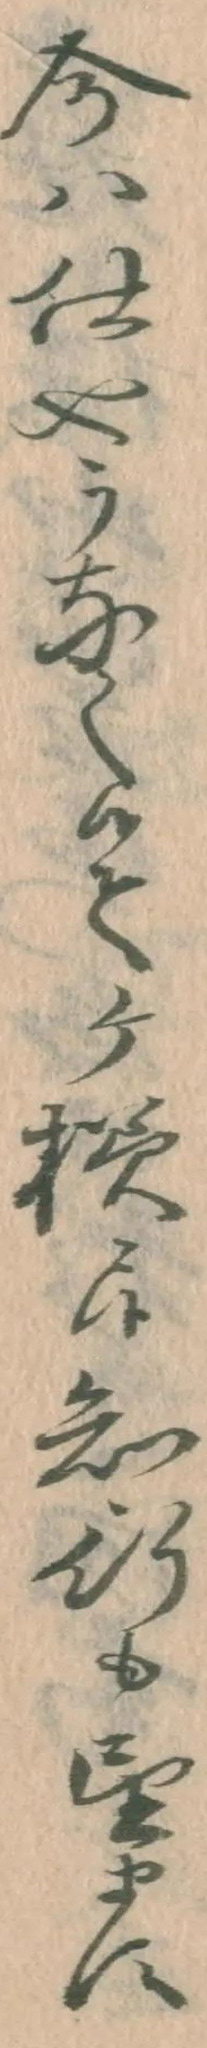今は仕やうなく候てけ様に候知行も望ま須
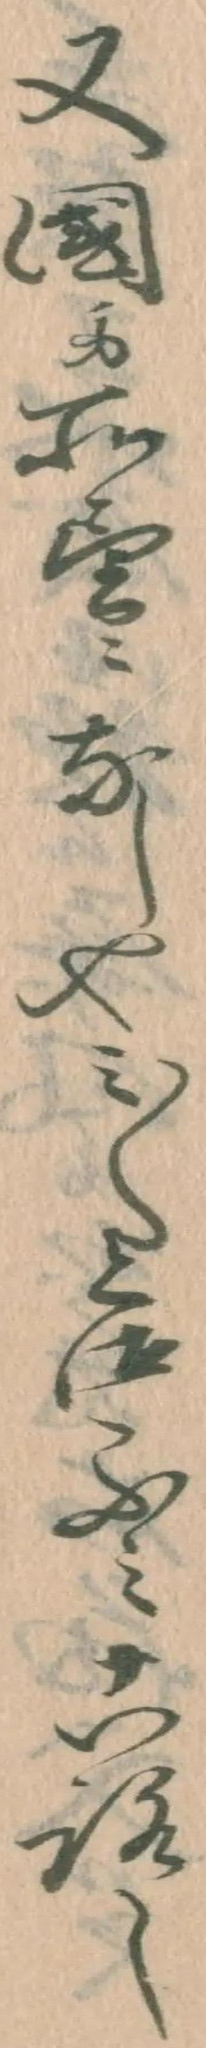又国も所望になしやみ〳〵と御ふみ古路し
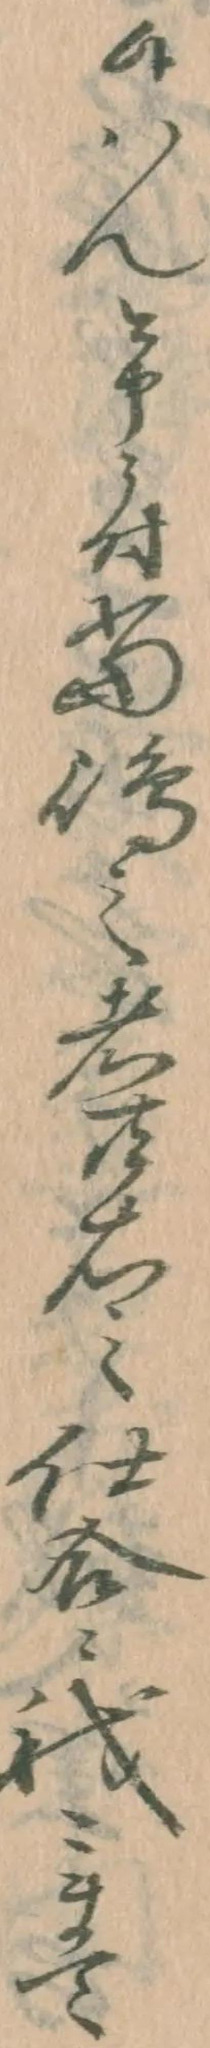候はんと申に付当島之者共右之仕合に我々まて
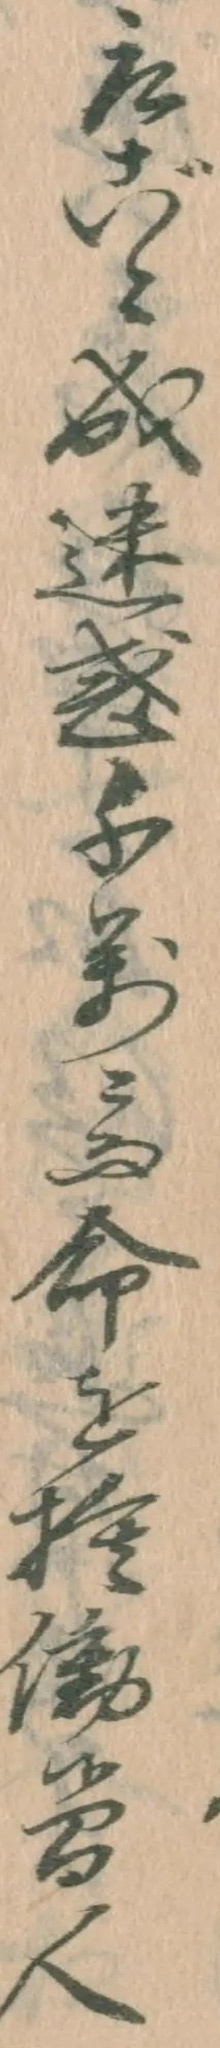取ごと成迷惑千万に而命を捨働候間人
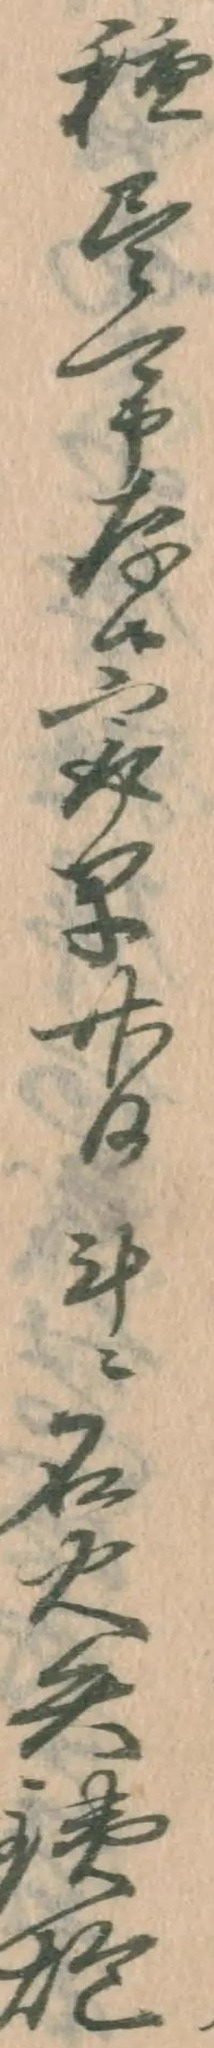種尽可申存候最早廿日斗に石火矢鉄炮
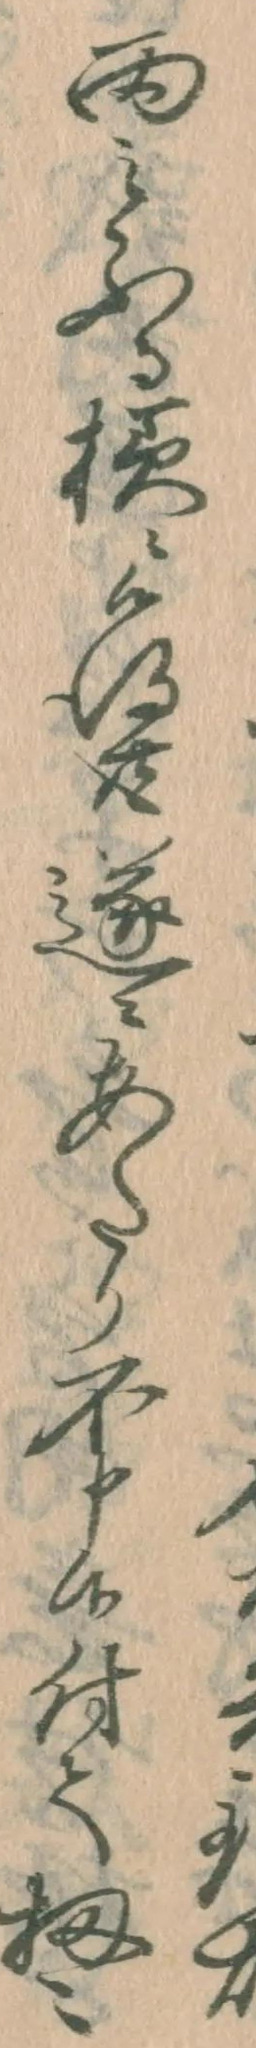雨之ふる様に候得共遂にあたり不申候付て扨々
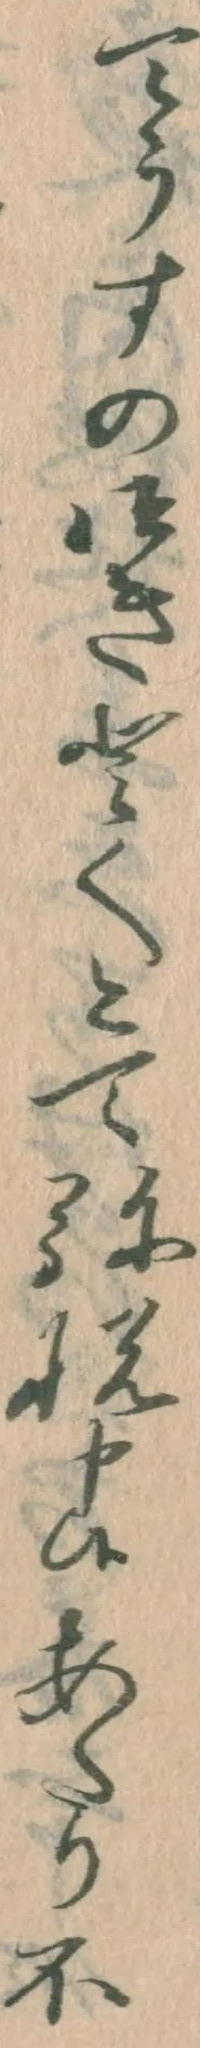てらすの御き登くとて弥悦申候あたり不
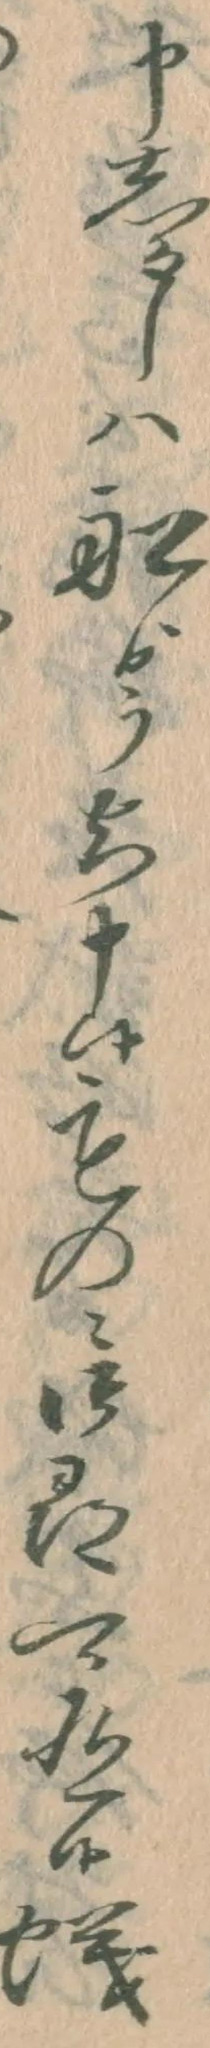申志るしは舩ゟうち申候ものに御尋可為候蟻
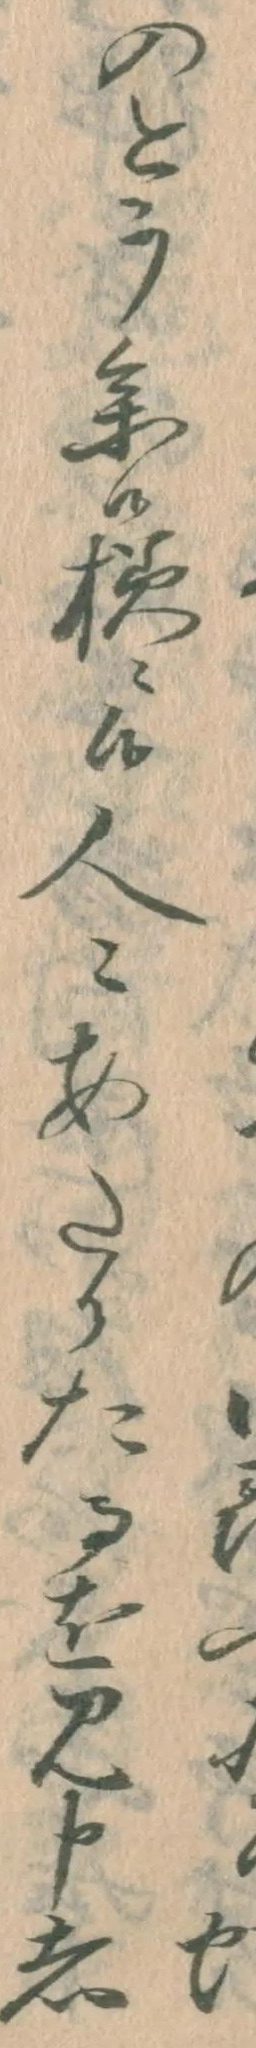のとう参候様に候人々あたりたるを見申者
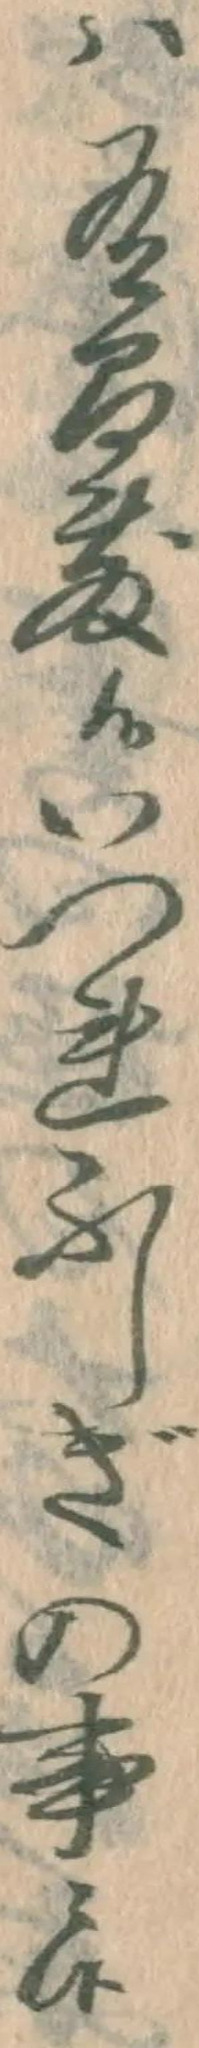は有間敷候いつ連ふしぎの事に候
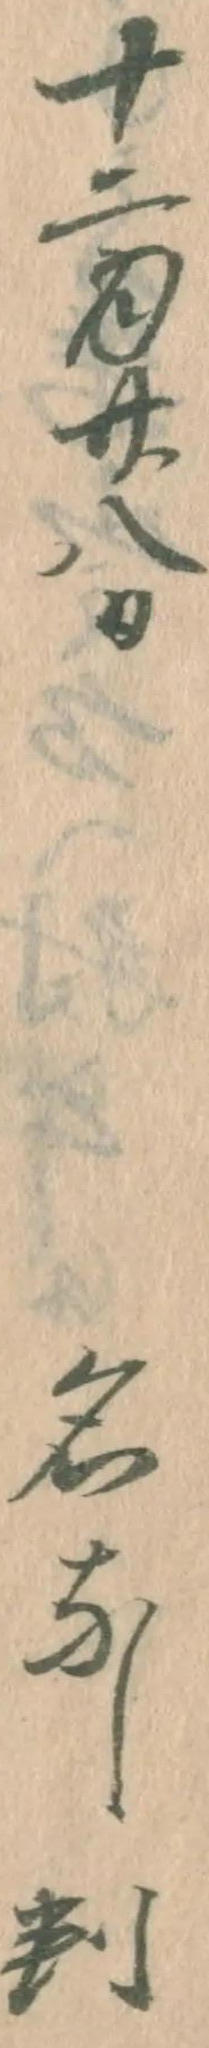十二月廿八日名なし判
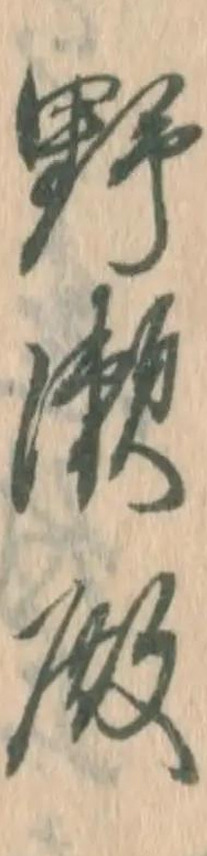野瀬殿

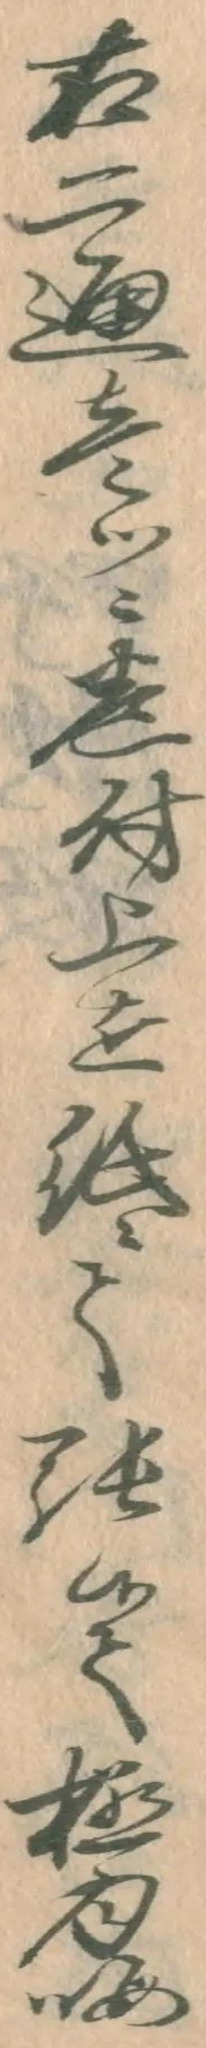右二通壱つに巻付上を紙にて張候て極月晦
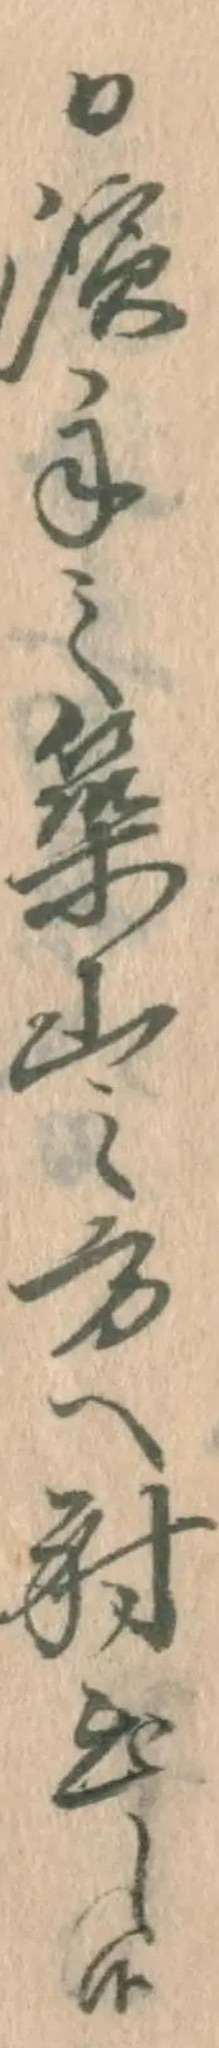日浜手之築山之方へ射出し候
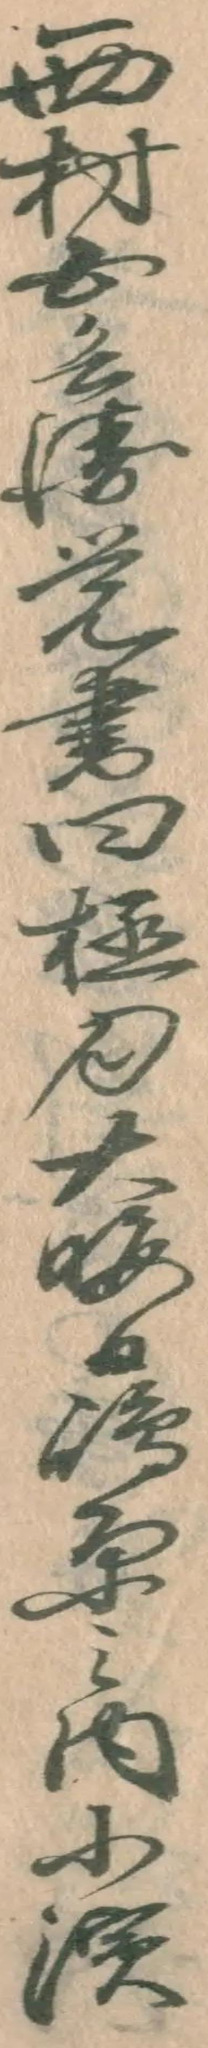西村五兵衛覚書曰極月大晦日島原之内小浜
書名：切支丹御退治記 49巻. [5]
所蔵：国立国会図書館 National Diet Library, JAPAN
